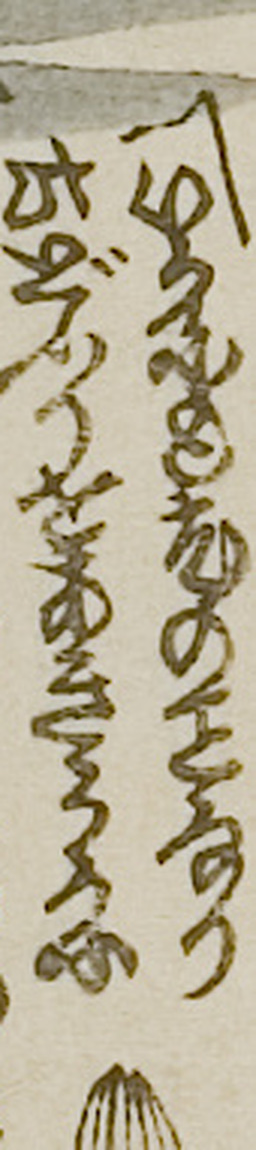此どふりをあきらかに
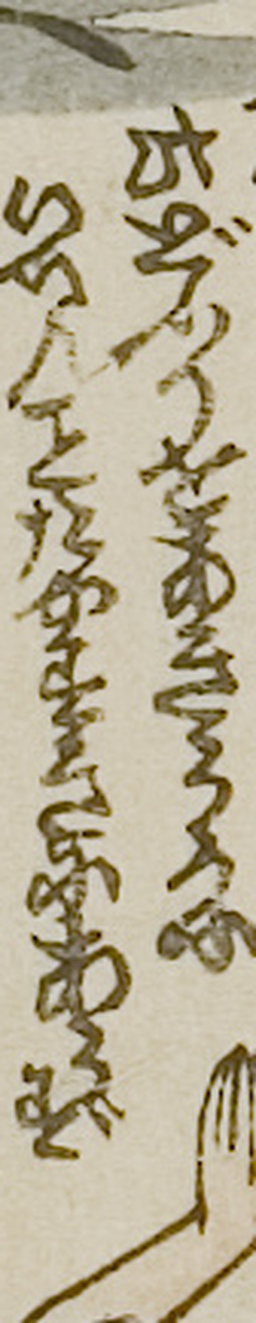いはんことたやすきにあらず
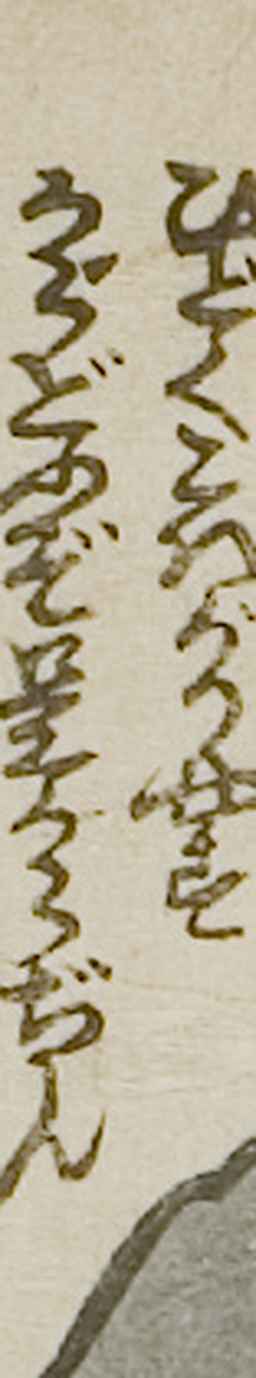からどふぞ是からぢしん
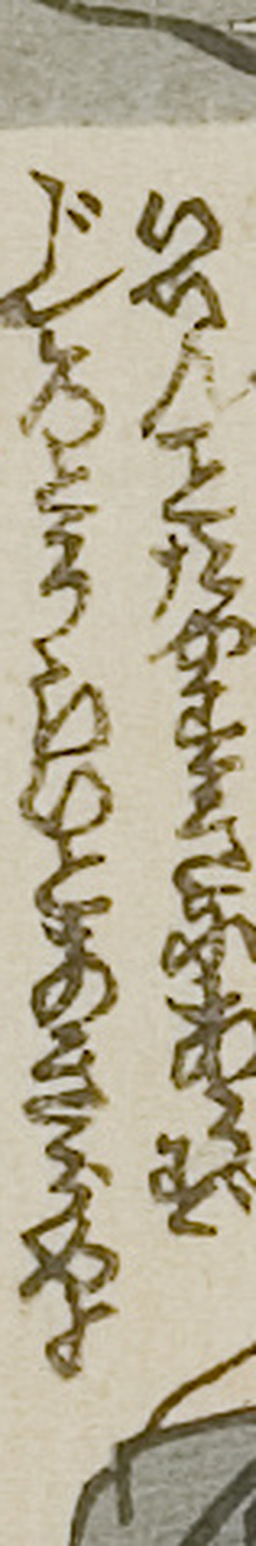じんろとうらいとあきらめよ
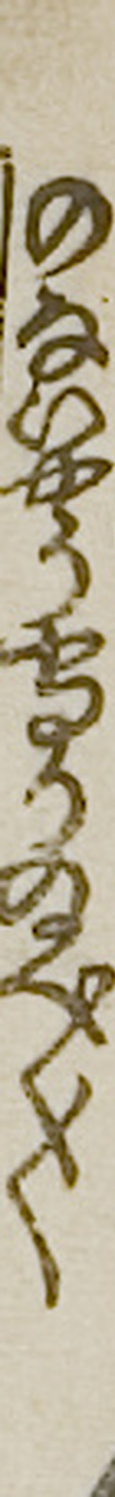のないやう守り給へ〳〵〳〵
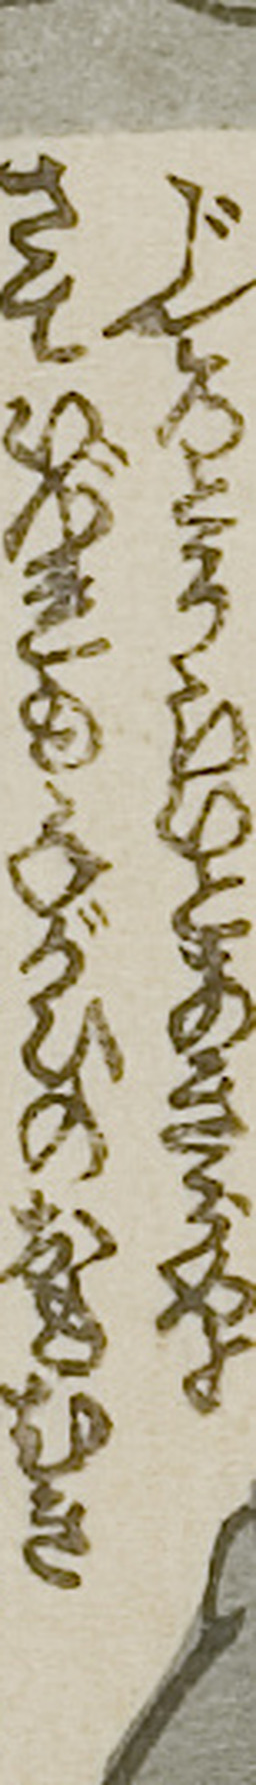さていづれもねがひのおもむき
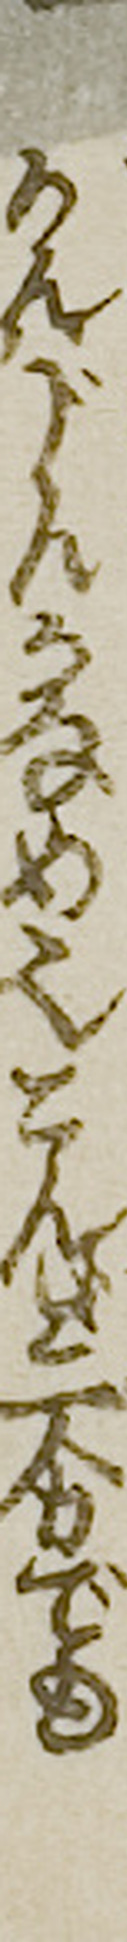かんじんかなめ也こんど一分でも
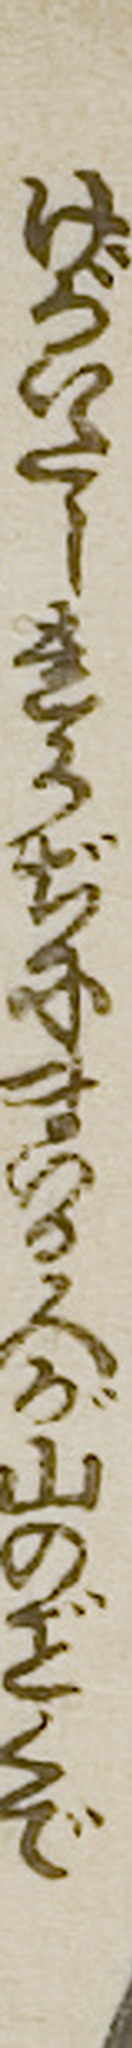けがいたしれうぢにまいる人が山のごとくで
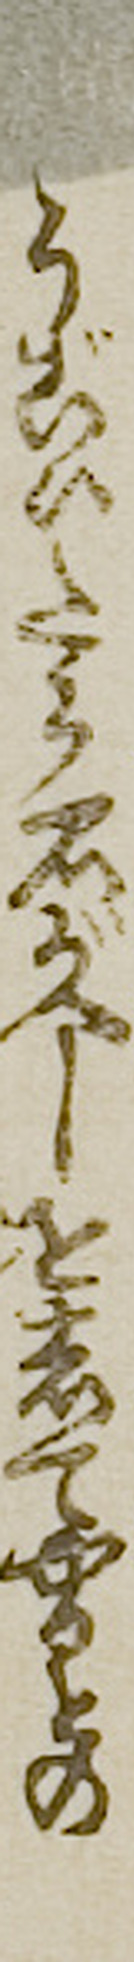うごひたら石がへしをしてやるとの
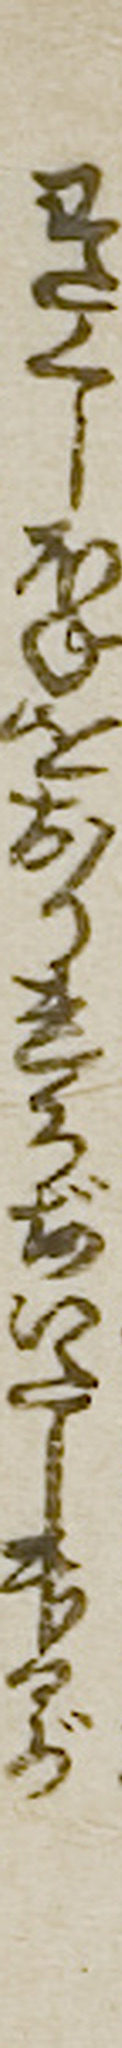わたくしほねをおりれうぢいたし升るが
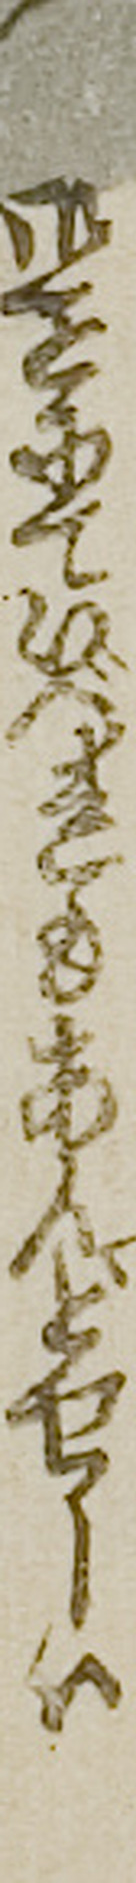御ことにていづれもあんどせしは
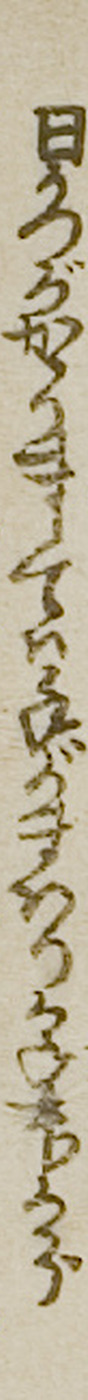日かつがかゝりましては手がまはりかね升から
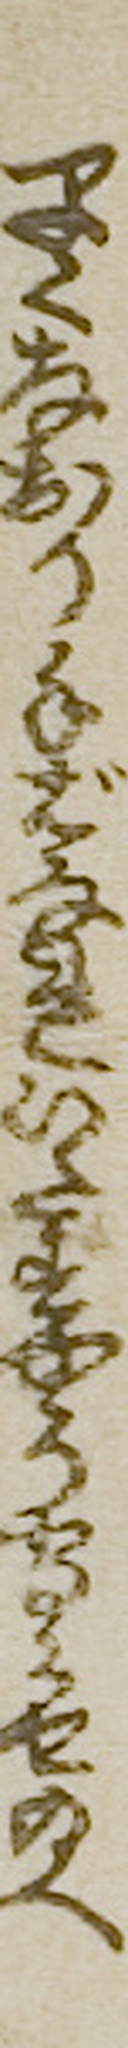早くなおり手ばなれいたすやう守らせ給へ
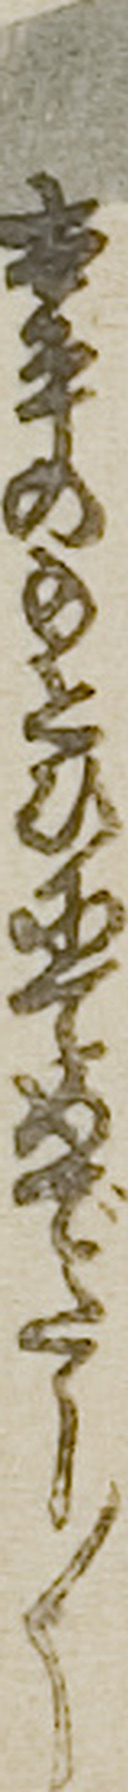太平のもとひにてめでたし〳〵
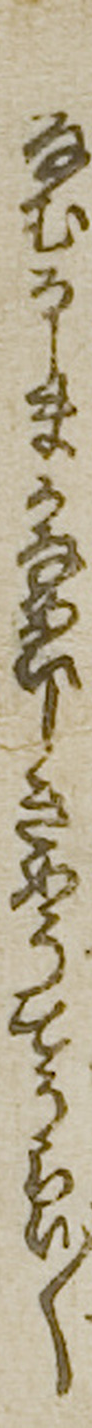なむかしまかなめいしきめうてうらい〳〵
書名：あんしん要石
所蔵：東京大学総合図書館 General Library in the University of Tokyo, JAPAN
